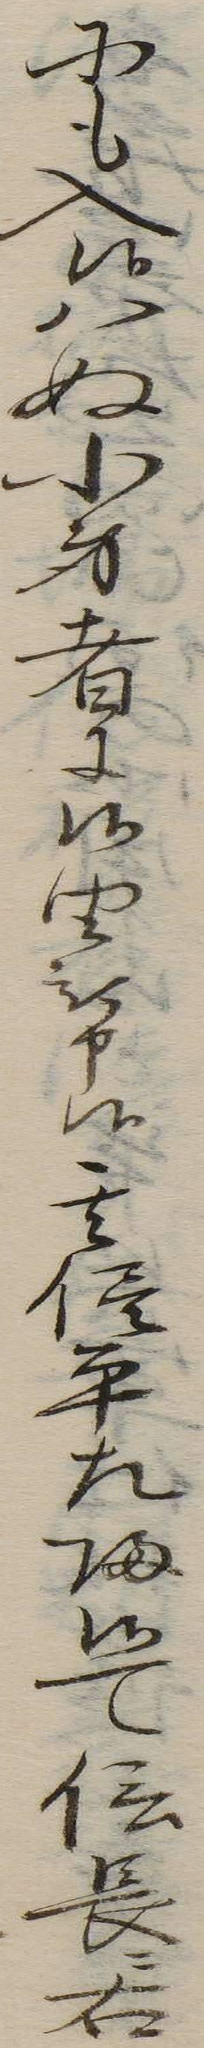にも入候はぬ小身者に候由被申候其侭平左帰候て信長ニ右
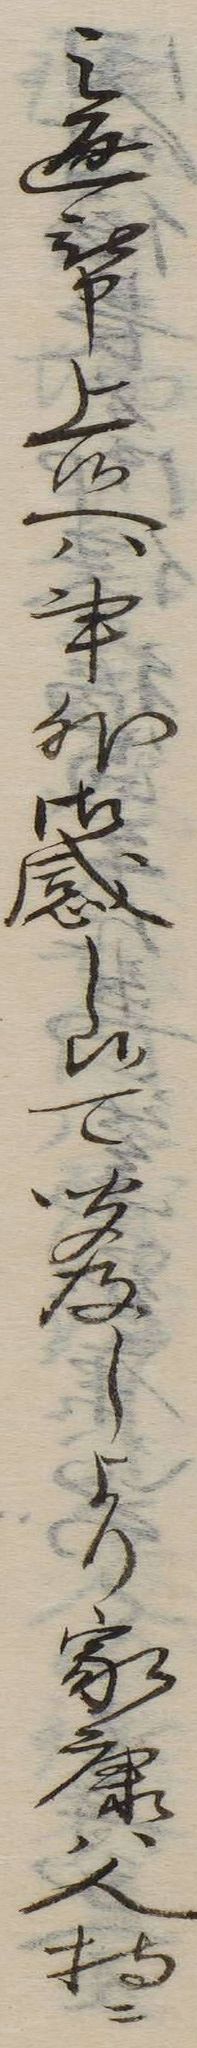之通被申上候へは事外御感し候て聞及しより家康は人持ニ
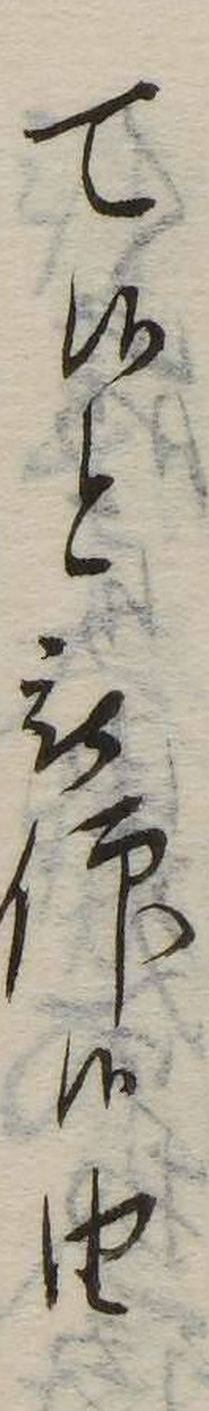て候と被仰候由
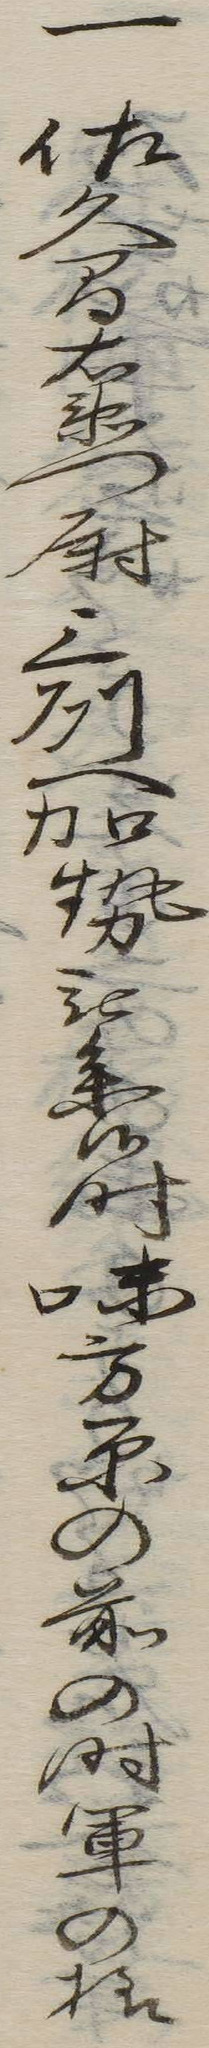一佐久間右衛門尉三州へ加勢被参候時味方原の前の時軍の様
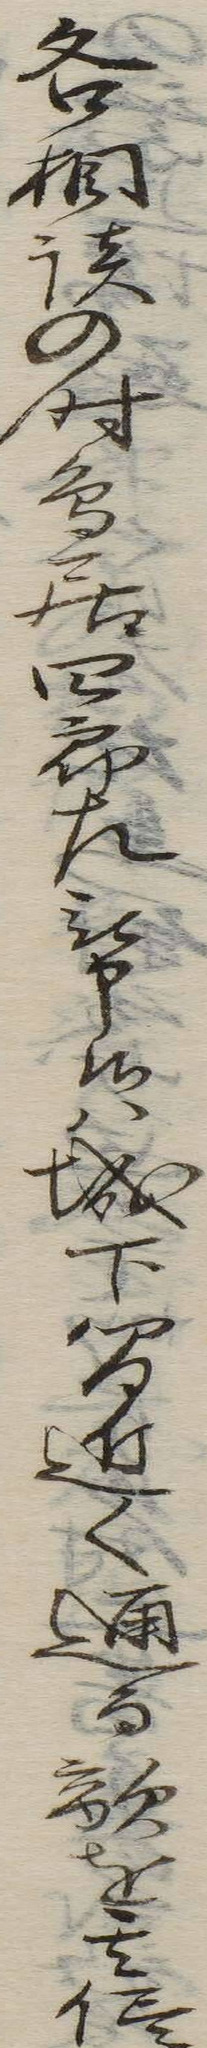各相談の時鳥居四郎被申候は城下間近く通る敵を其侭
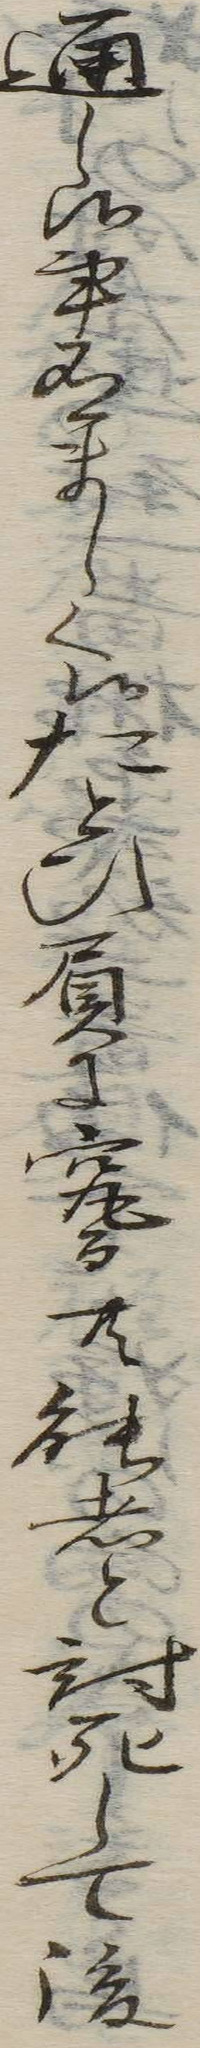通し候事有ましく候たとひ負に究る共能者と討死して後
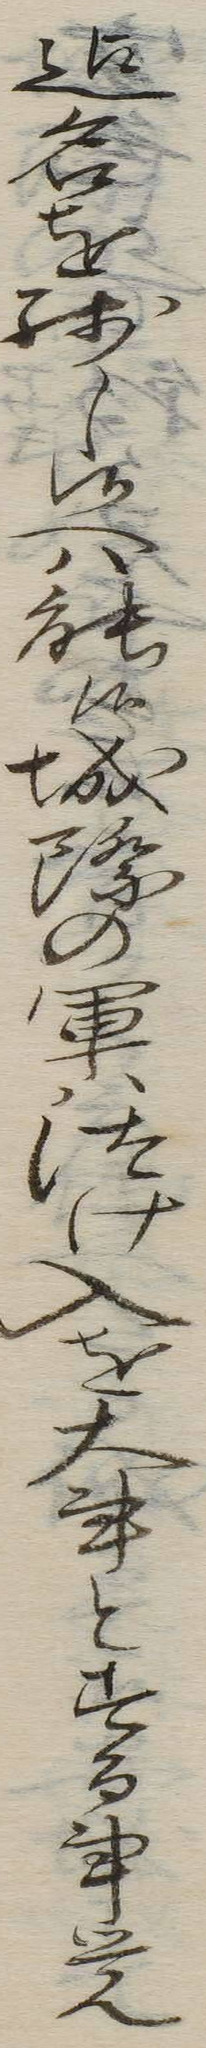迄名を残し候へは能候城際の軍はつけ入を大事とする事覚
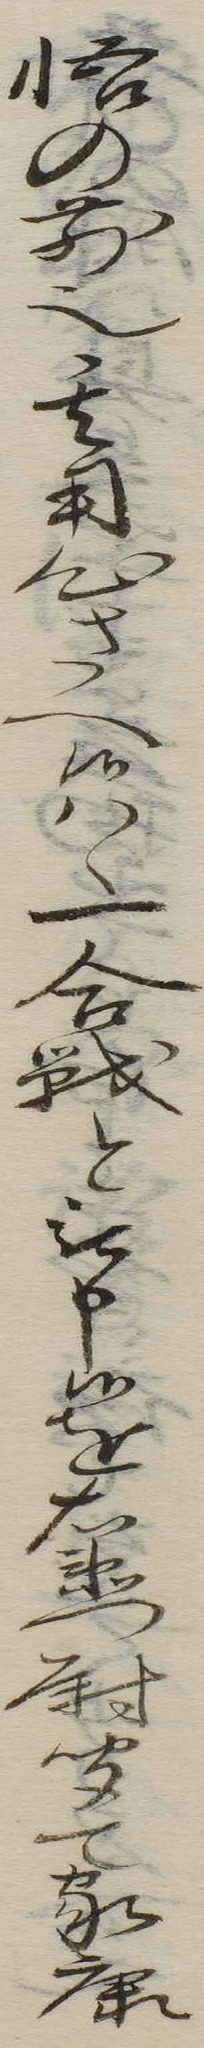悟の前也其用心さへ候はゝ一合戦と被申候を右衛門尉聞て家康
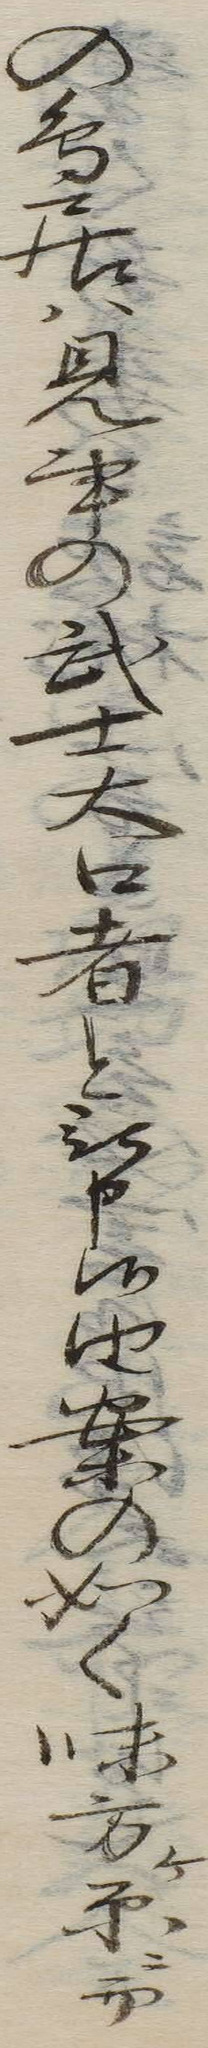の鳥居は見事の武士大口者と被申由案の如く味方ケ原ニ而
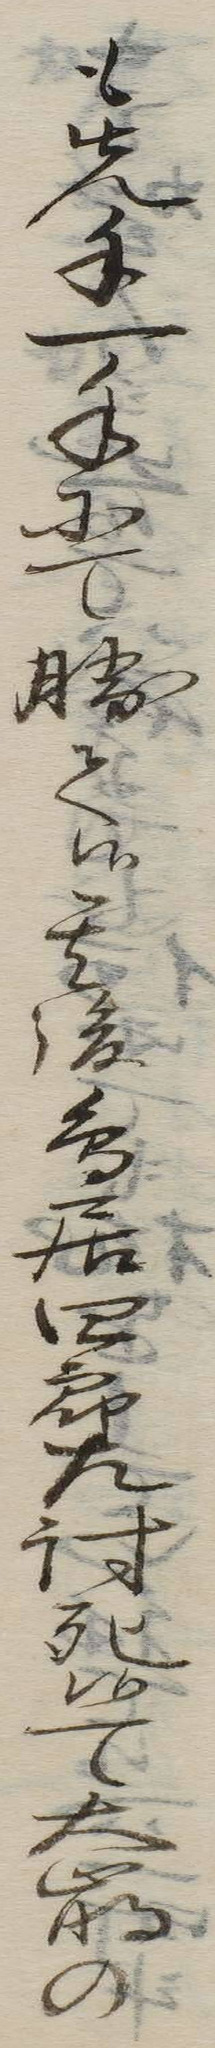も先手一手にて勝て候其後鳥居四郎左討死候て大崩の
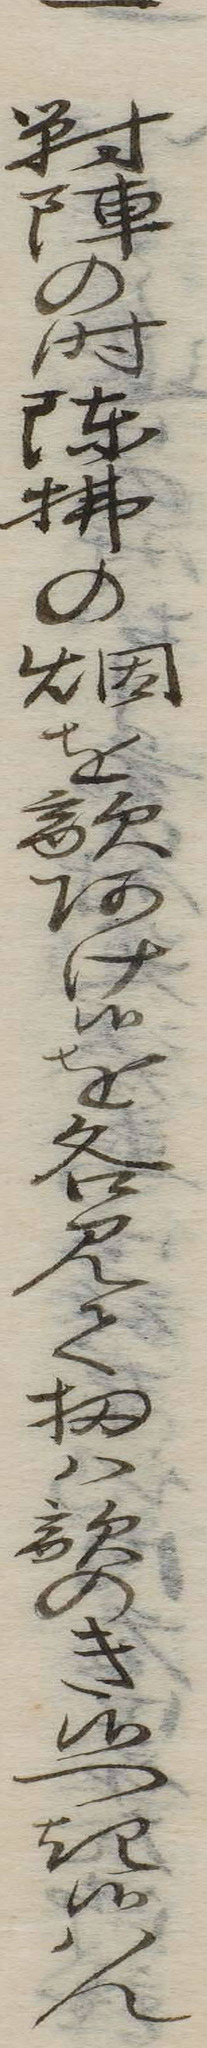一戦陣の時陣拂の烟を敵あけ候を各見て扨は敵のき候つき候はん
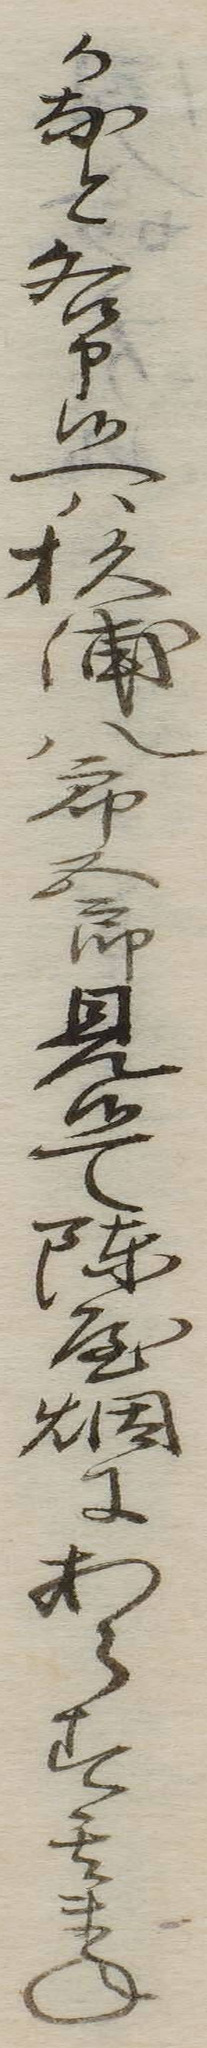かなと各申候へは杉浦八郎五郎身候て陣屋烟にあらす其まね
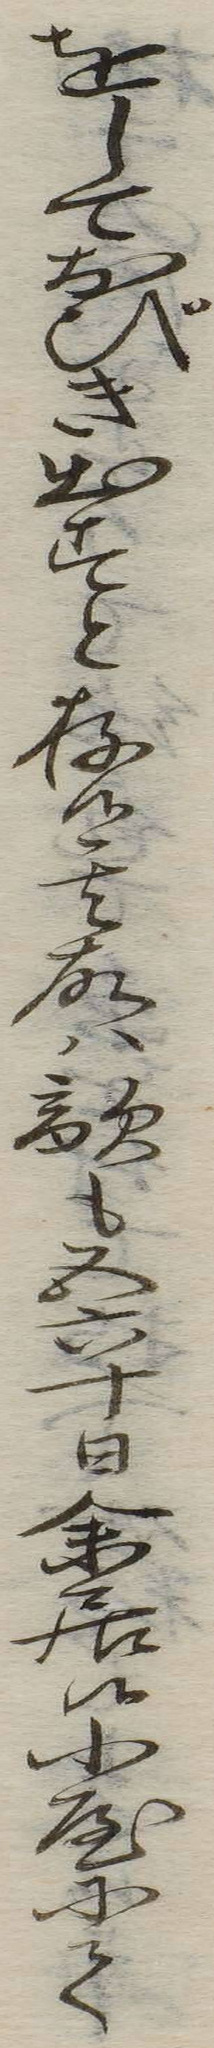をしておびき出すと存候其故は敵も五六十日余居候小屋にて
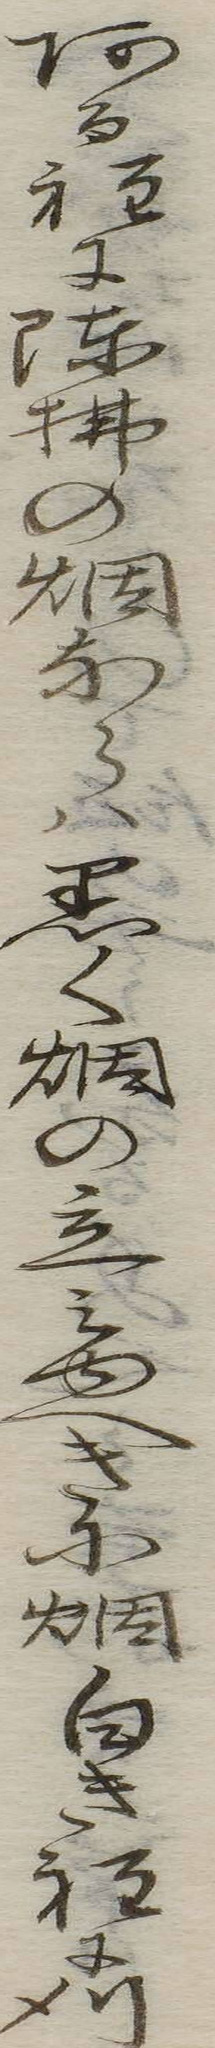ある程に陣拂の烟ならは黒く烟の立みゆへきに烟白き程に刈
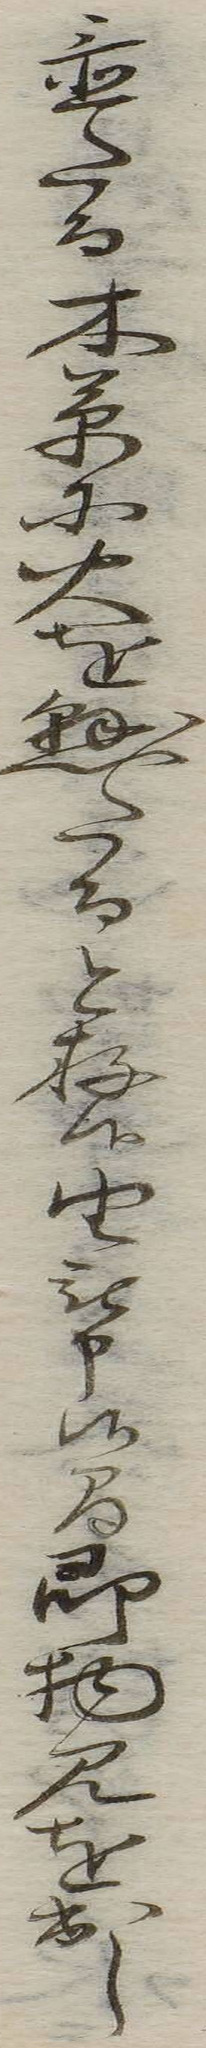置たる木草に火を懸たると存候由被申候間即物見を出し
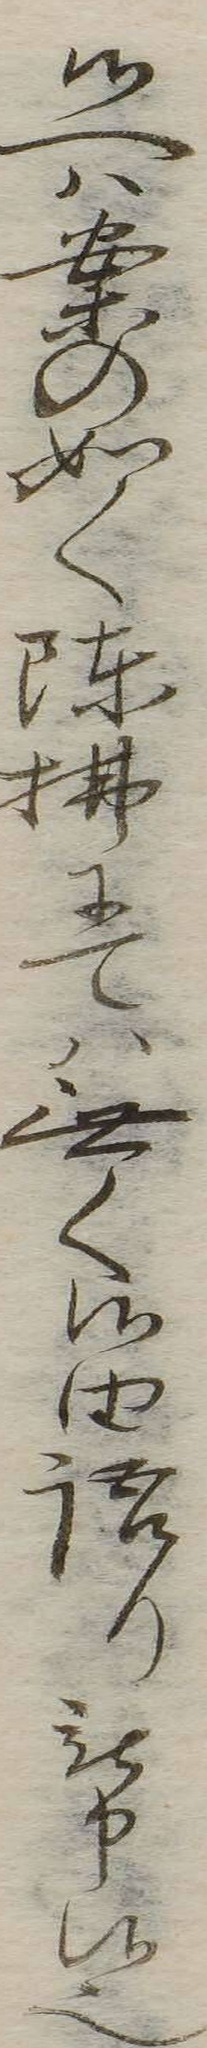候へは案の如く陣拂にては無く候由語り被申候也
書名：三河之物語
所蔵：国文学研究資料館
